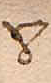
8
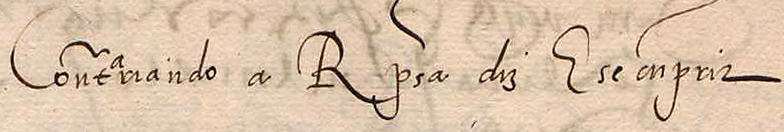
Contrariando a R p̄sa diz E se cūprir
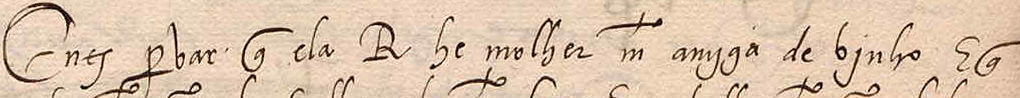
Entꝭ ꝓvar q̄ ela R. he molher mto amjga de vjnho E q̄
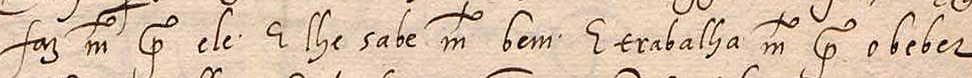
faz mto p̄o ele E lhe sabe mto bem E trabalha mto p̄o o beber
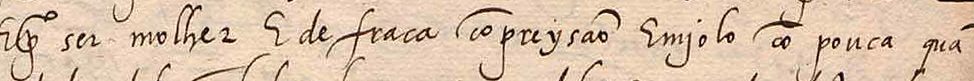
E p̄o ser molher E de fraca c̄opreysão E mjolo c̄o pouca quā
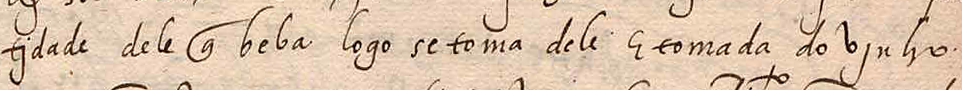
tjdade dele q̄ beba logo se toma dele E tomada do vjnho
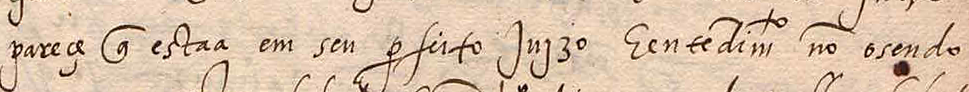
parece q̄ estaa em seu ꝑfeito Jujzo E entēdimto nō o sendo
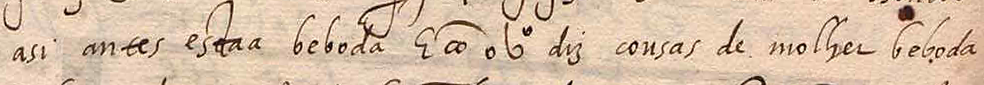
asi antes estaa beboda E c̄o o vo diz cousas de molher beboda
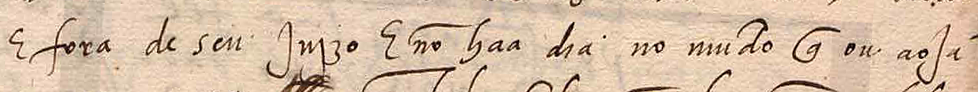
E fora de seu Jujzo E n̄o haa dia no mūdo q̄ ou ao Jā
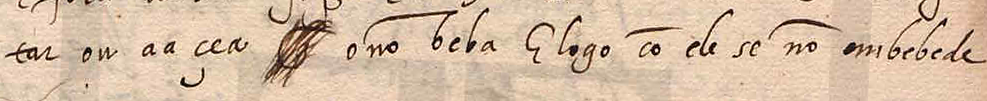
tar ou aa cea q̄ o nō beba E logo c̄o ele se n̄o embebede
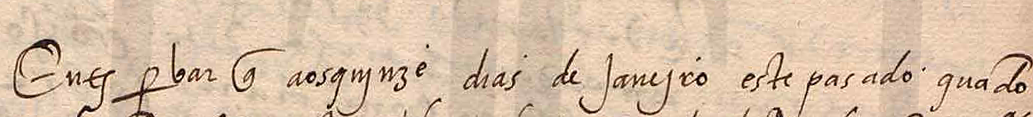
Entꝭ ꝓvar q̄ aos qujnze dias de Janejro este pasado. quādo
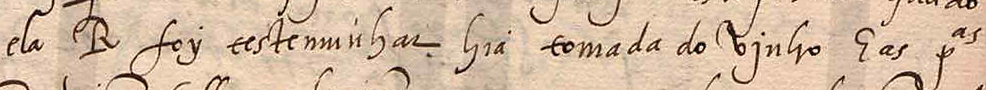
ela R foy testemunhar hia tomada do vinho E as pas
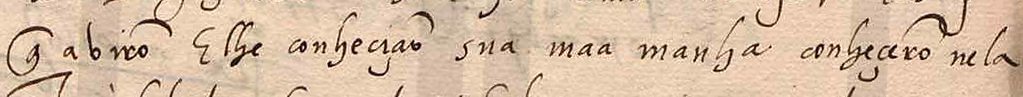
q̄ a virō E lhe conhecião sua maa manha conhecerō nela
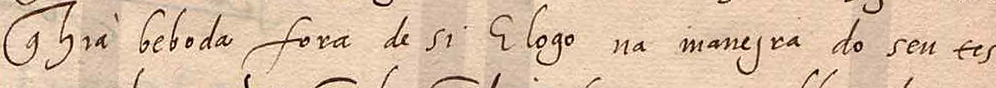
q̄ hia beboda fora de si E logo na manejra do seu tes
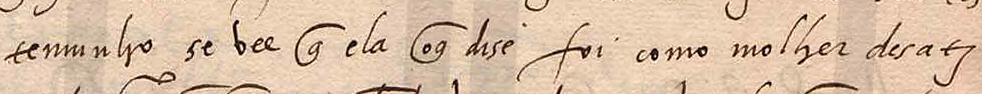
temunho se vee q̄ ela o q̄ dise foi como molher desatj
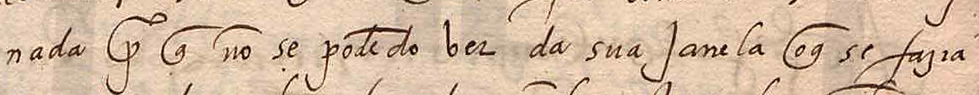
nada p̄oq̄ nō se podēdo ver da sua Janela o q̄ se fazia
